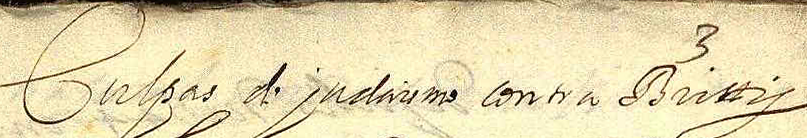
Culpas de judaismo contra Brittis
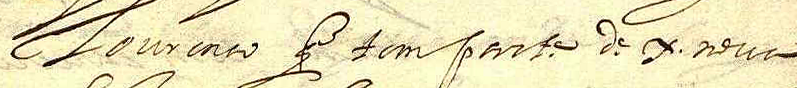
Lourenso q̄ tem parte de x. noua
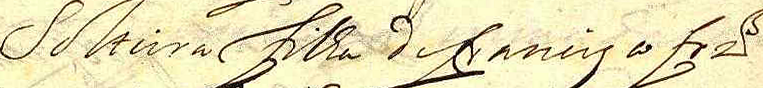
Solteira filha de francisco frz̄
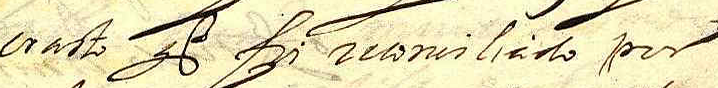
crasto gs foi reconciliado por
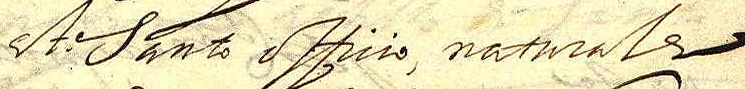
este Santo officio, natural e
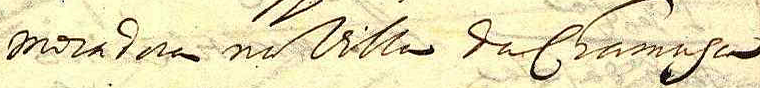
moradora na Villa da Chamusca
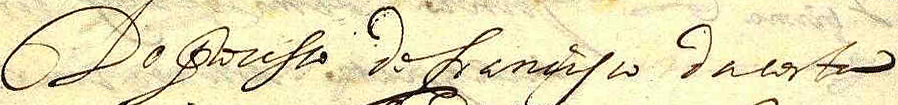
Do processo de francisco da costa
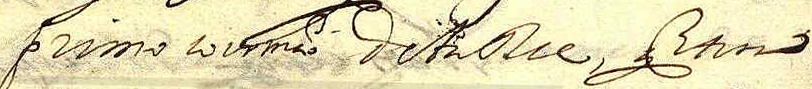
primo co irmaõ dita Ree, q̄ tem
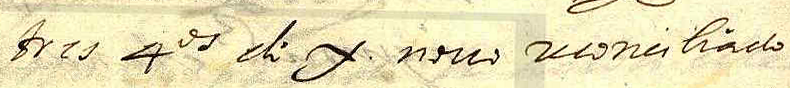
tres 4os de x. nouo reconciliado
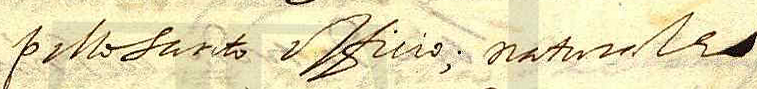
pello Santo officio; natural e
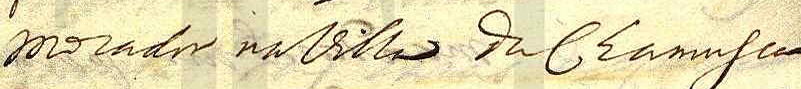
morador na Villa da Chamusca
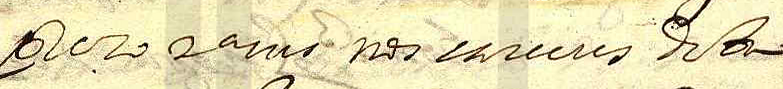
prezo 2a ves nos carceres desta
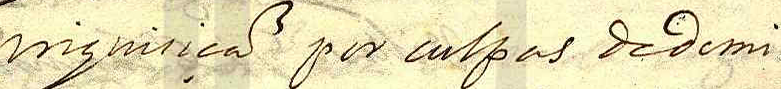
inquisiçã por culpas de demi
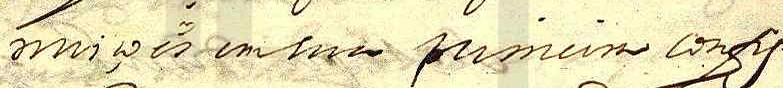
nuiçoes em sua primeira confis
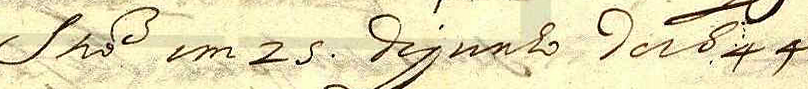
saõ em 25. de junho de 1644
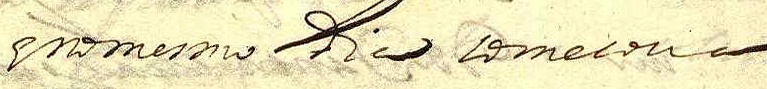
e no mesmo dia comecou a
